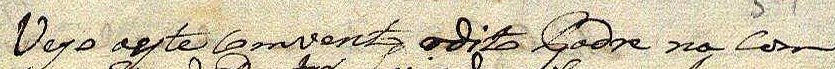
Veyo a este comvento o dito Padre na Com
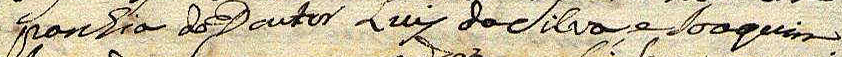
panhia do Doutor Luis da Silva, e Ioaquim
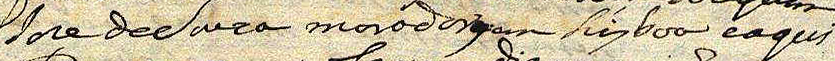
Ioze de souza moradores em Lisboa e aqui
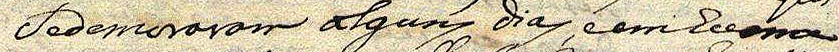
se demoraram alguns dias e em huma
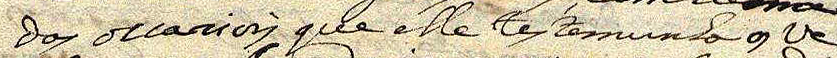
das occaziois que elle testemunha os ve
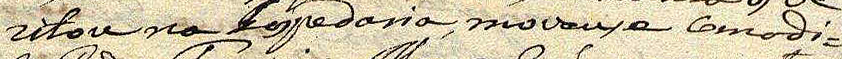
zitou na hospedaria, moveuse com o di
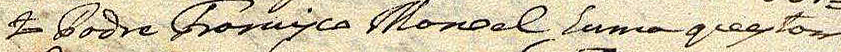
to Padre Francisco Manoel huma questam
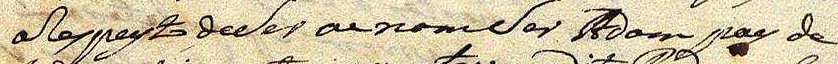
a Respeyto de ser ou nam Ser Adam pay de
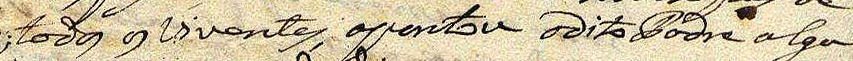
todos os viventes, apontou o dito Padre algu
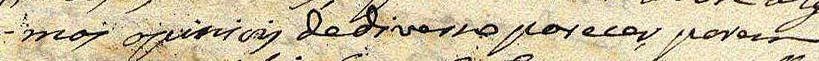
mas opiniois de diverso parecer, porem
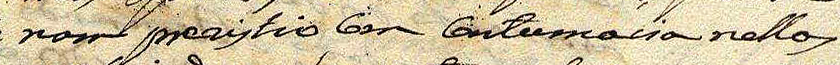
nam prezistio com contumacia nellas
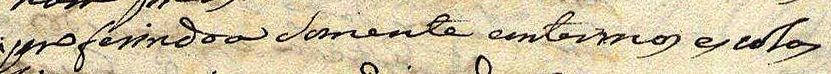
proferindoa somente em termos escolas
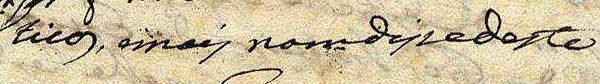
ticos, e mais nam disse deste
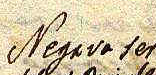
Negava ser
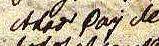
Adaõ Pay de
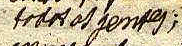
todas as gentes;
